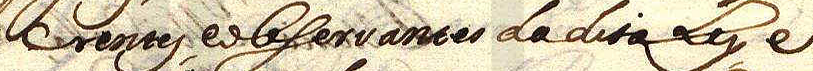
crentes, e observantes da dita Ley e
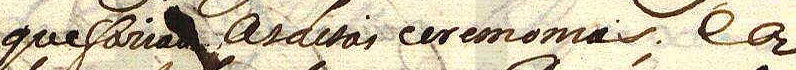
que faziao as ditas ceremonias; e os
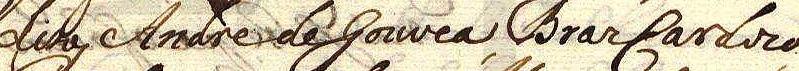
ditos Andre de Gouvea, Braz Cardozo,
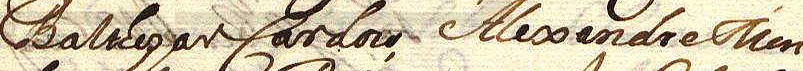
Balthezar Cardozo, Alexandre Men
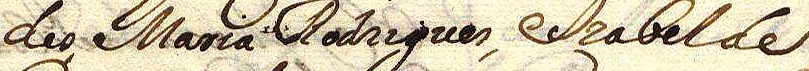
des, Maria Rodrigues, e Izabel de
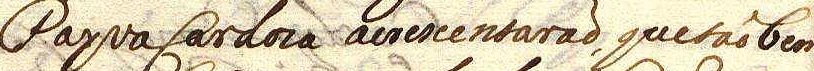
Payva Cardoza acrescentaraõ, que taõbem
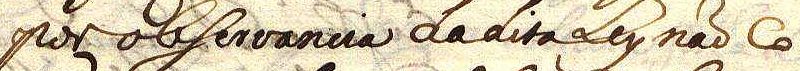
por observancia da dita Ley não co
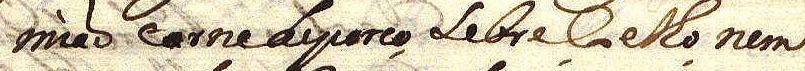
mião carne de porco, Lebre, Coelho, nem
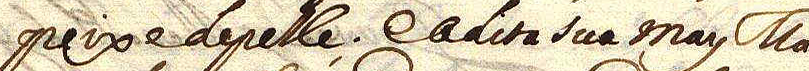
peixe de pelle; e a dita sua may Ma
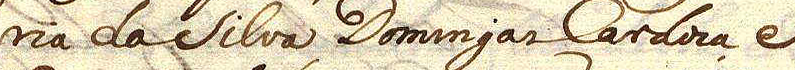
ria da Silva, Domingas Cardoza, e
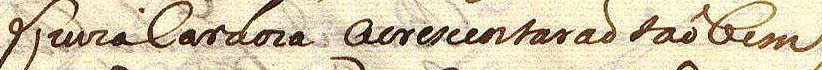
Luiza Cardoza acrescentaraõ taõbem
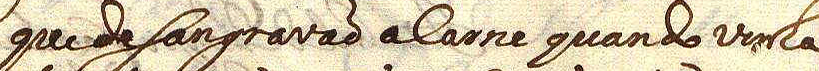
que desangravão a Carne quando vinha
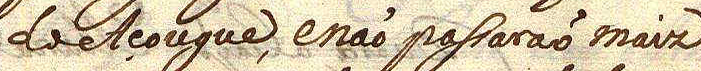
do Açougue, e naõ passaraõ maiz
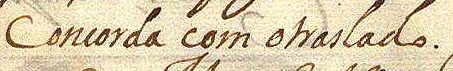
Concorda com o traslado.
